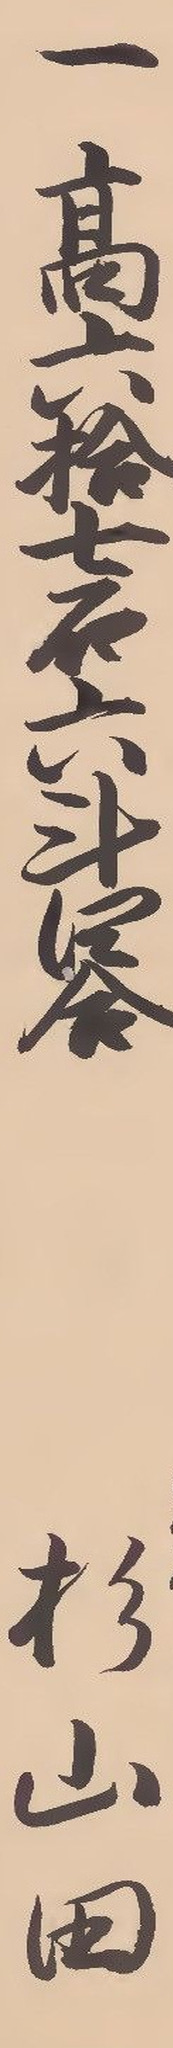一高六拾七石六斗四合杉山田
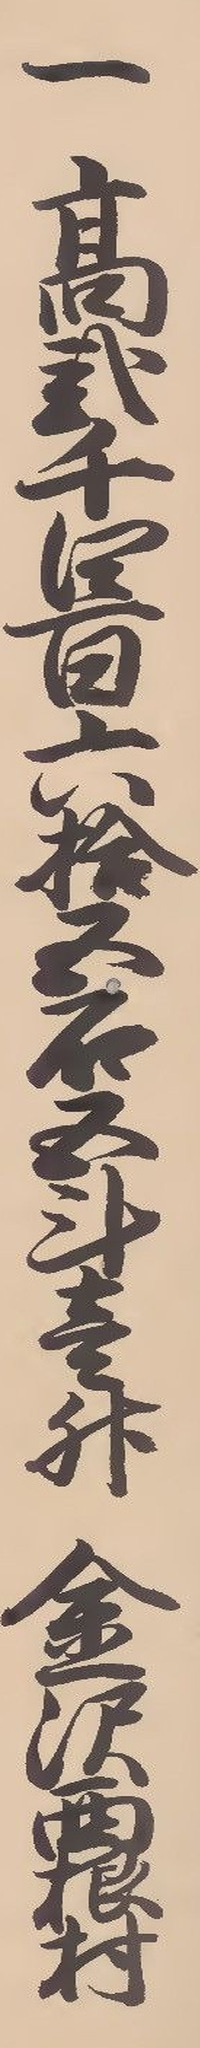一高弐千四百六拾五石五斗壱升金沢西根村
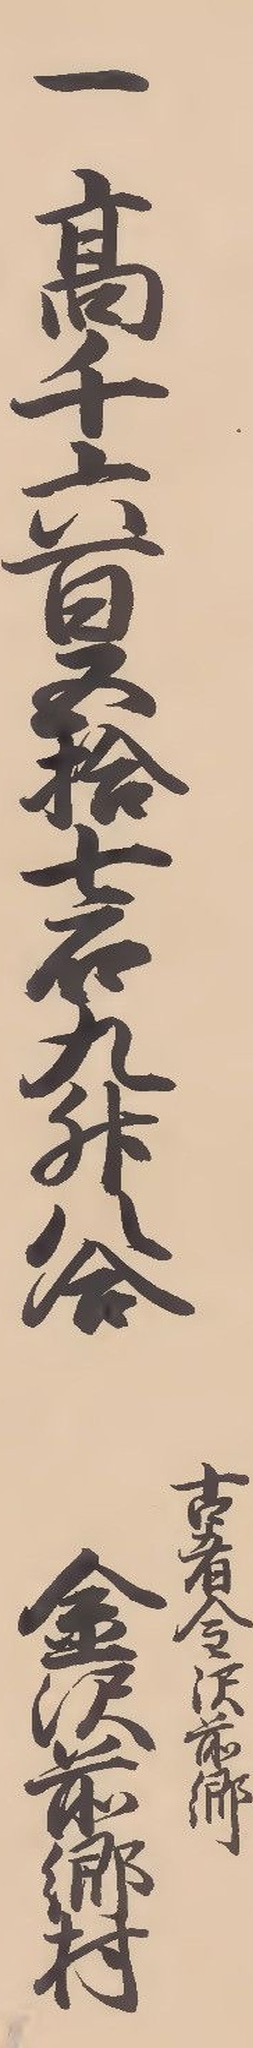一高千六百五拾七石九升八合金沢前郷村
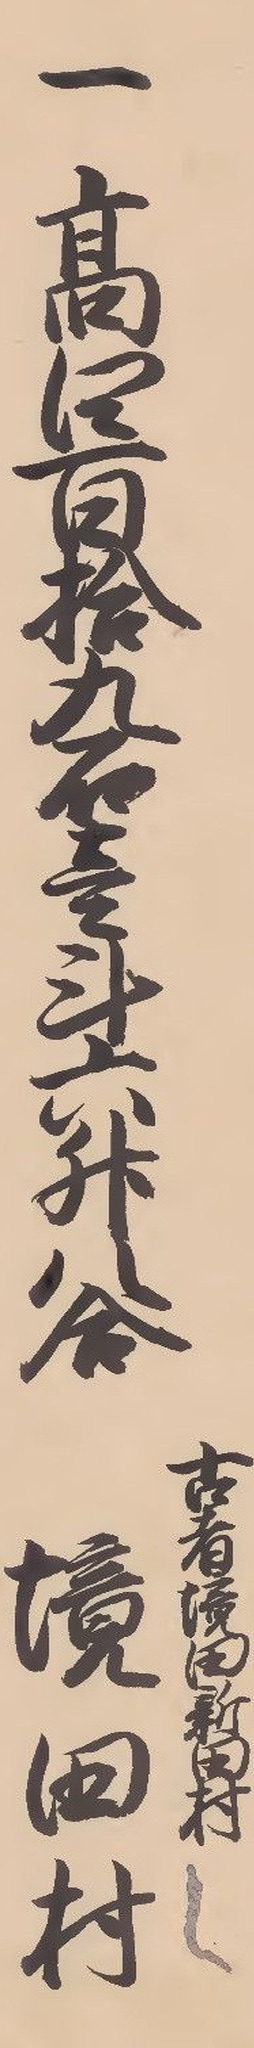一高四百拾九石壱斗六升八合境田村
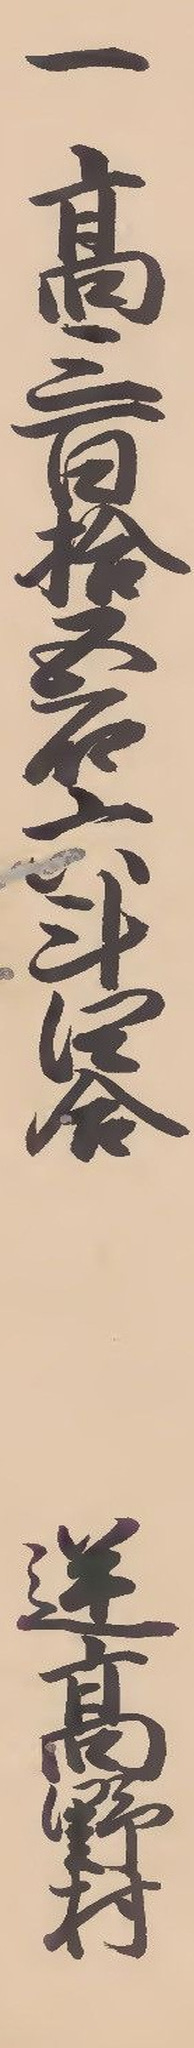一高三百拾五石六斗四合逆高野村

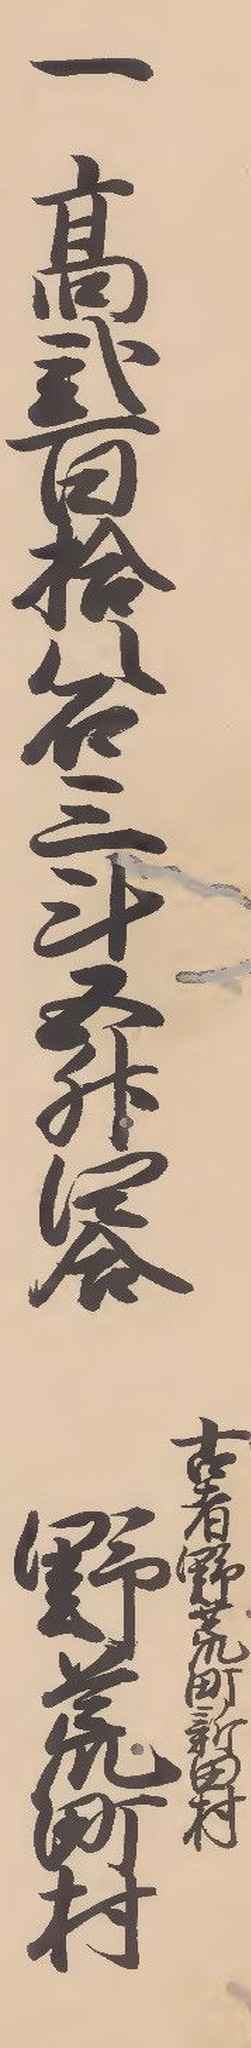一高弐百拾八石三斗五升四合野荒町村
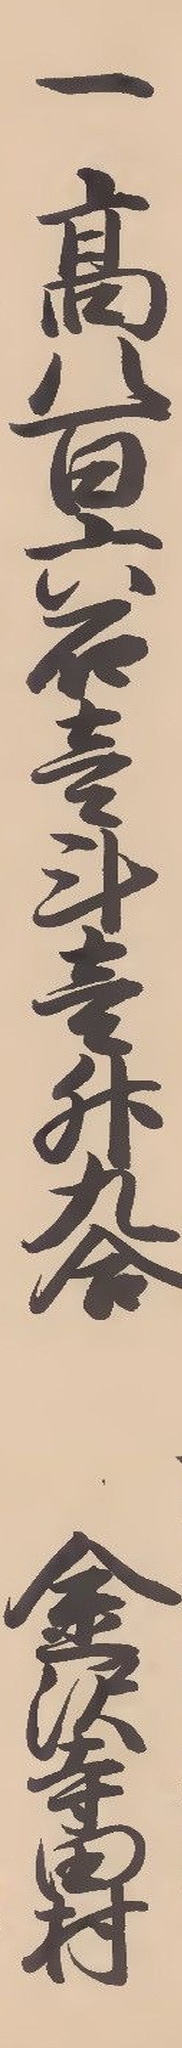一高八百六石壱斗壱升九合金沢寺田村
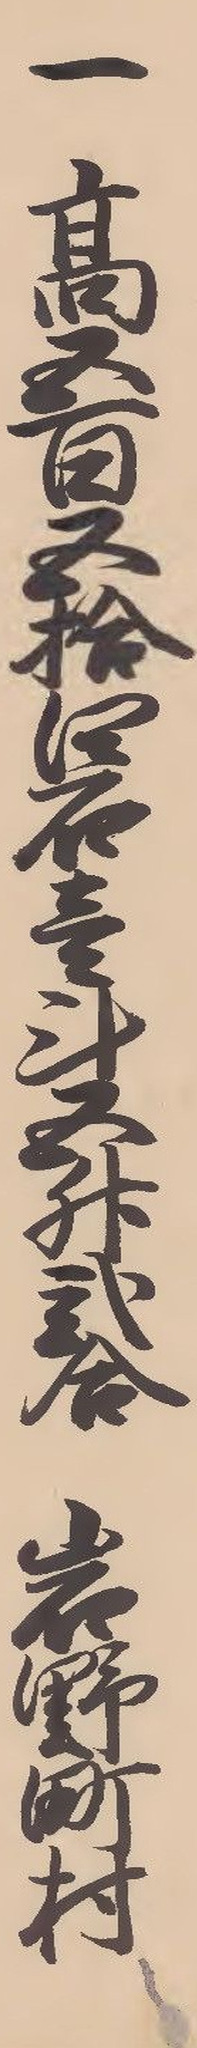一高五百五拾四石壱斗五升弐合岩野町村
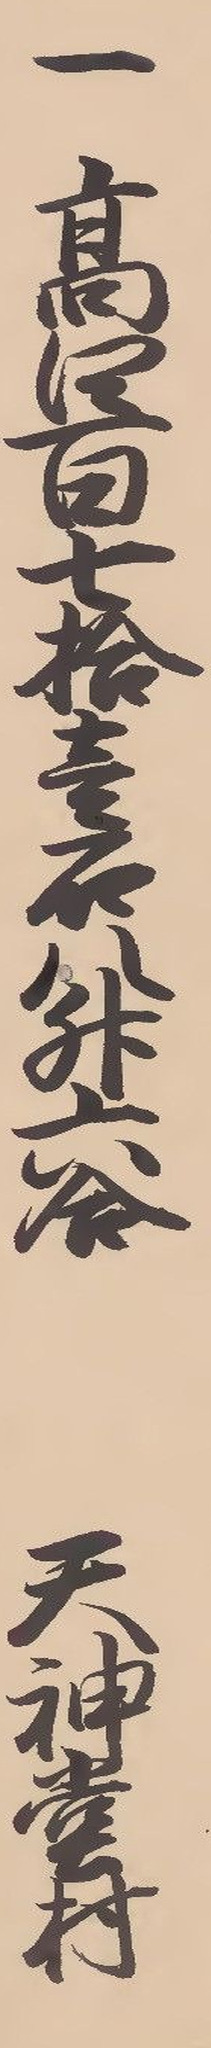一高四百七拾壱石八升六合天神堂村
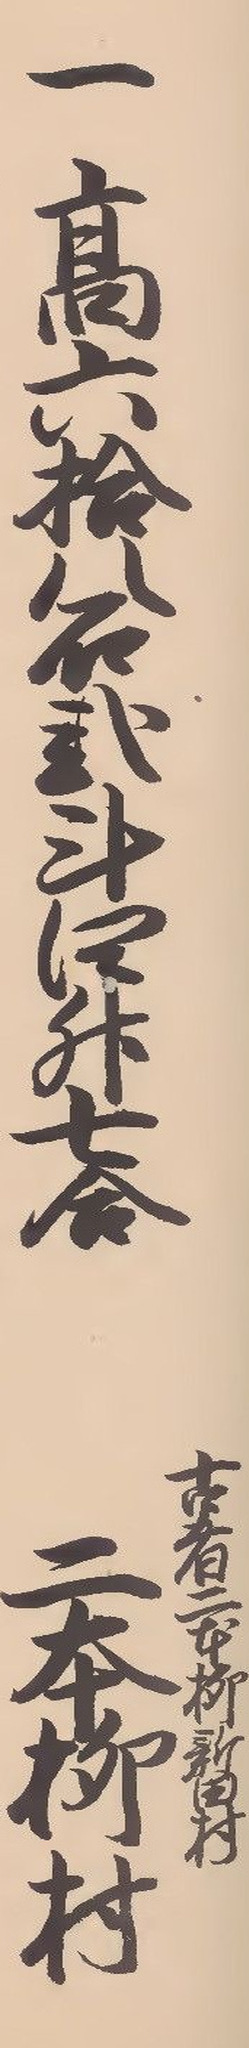一高六拾八石弐斗四升七合二本柳村
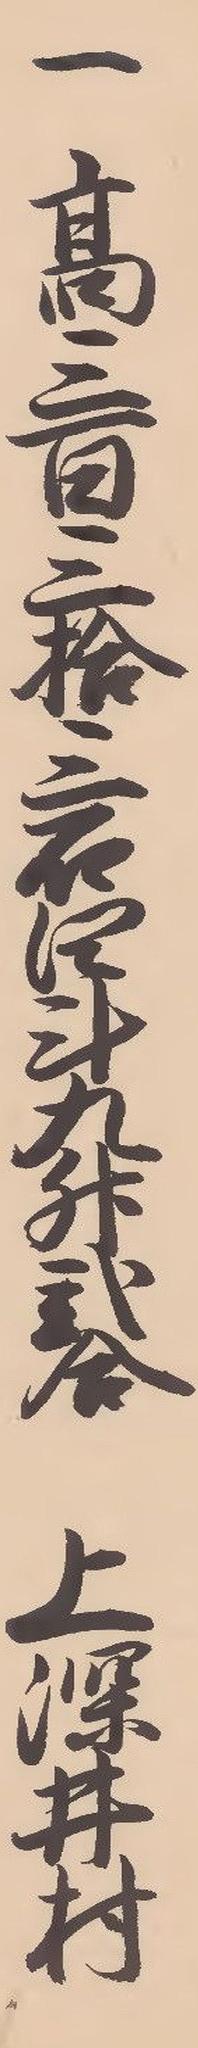一高三百三拾三石四斗九升弐合上深井村
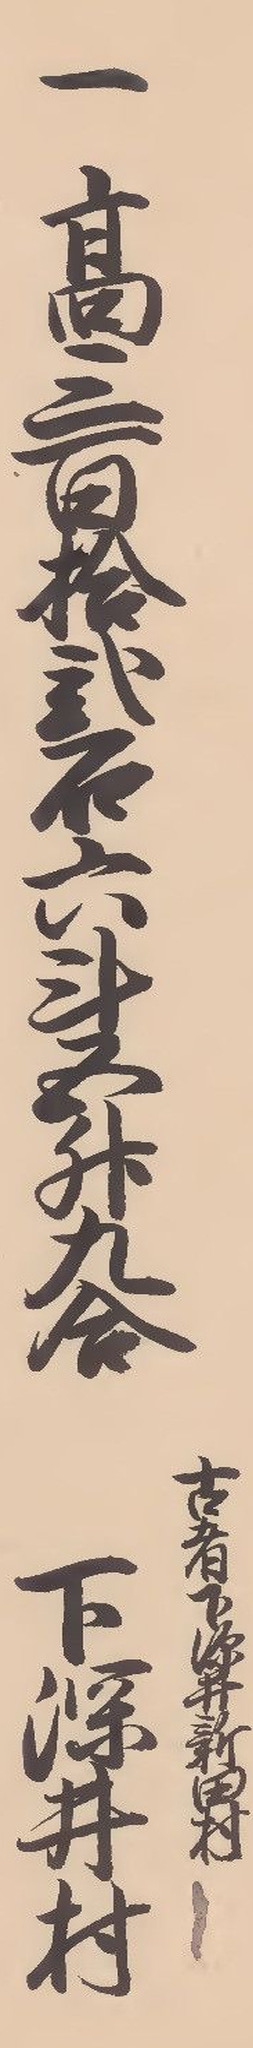一高三百拾弐石六斗五升九合下深井村
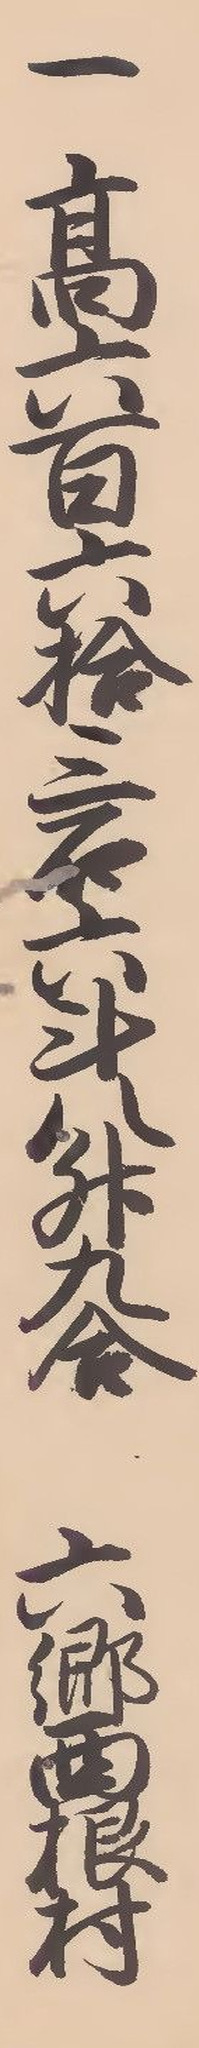一高六百六拾三石六斗八升九合六郷西根村

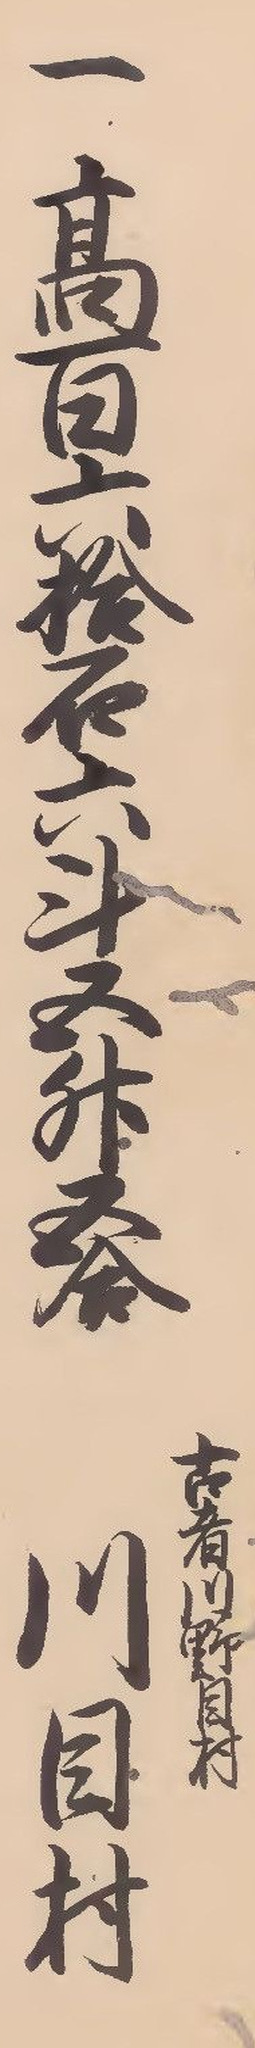一高百六拾石六斗五升五合川目村
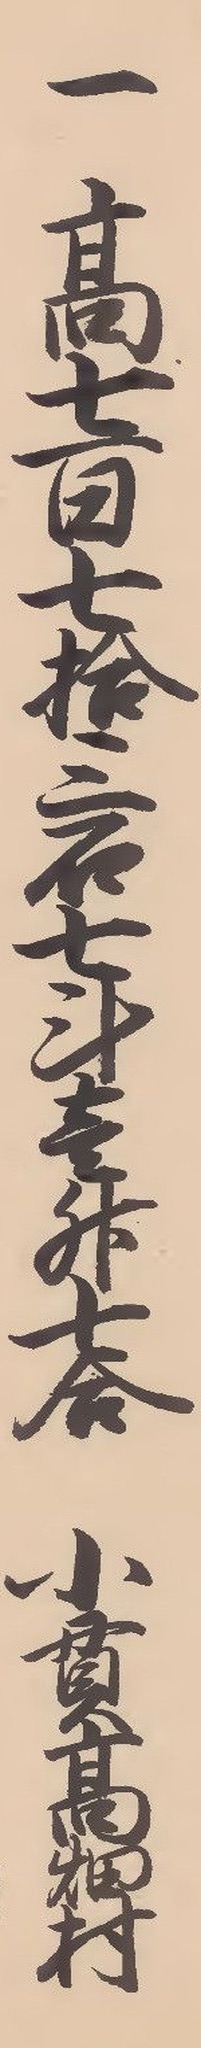一高七百七拾三石七斗壱升七合小貫高畑村
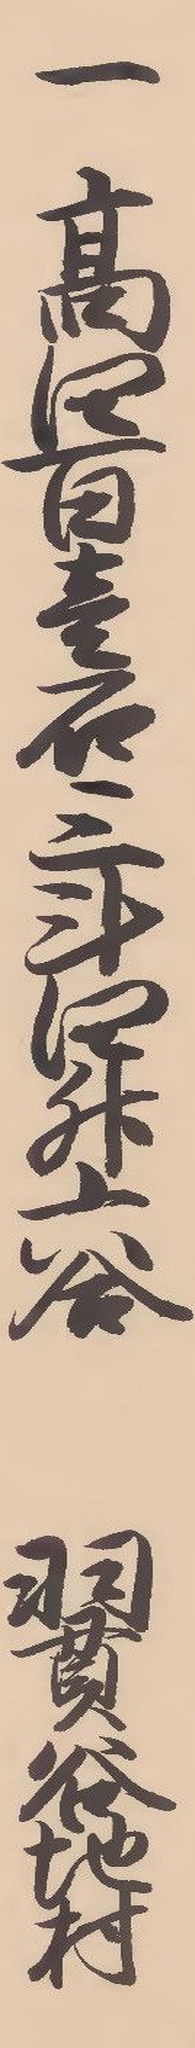一高四百壱石三斗四升六合羽貫谷地村
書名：出羽国郷帳　５
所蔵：国立公文書館 National Archives of Japan
